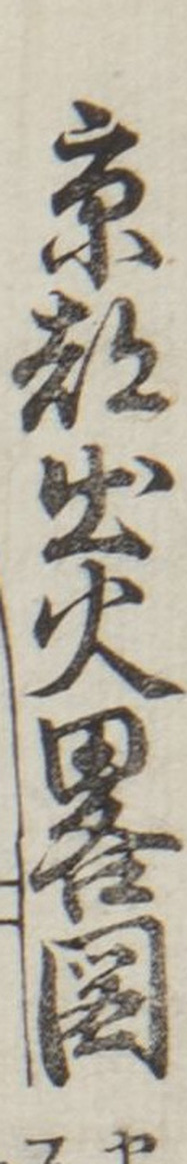京都出火略図
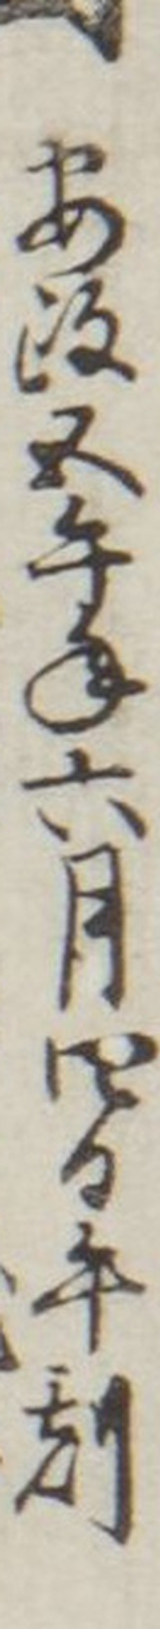安政五午年六月四日午刻
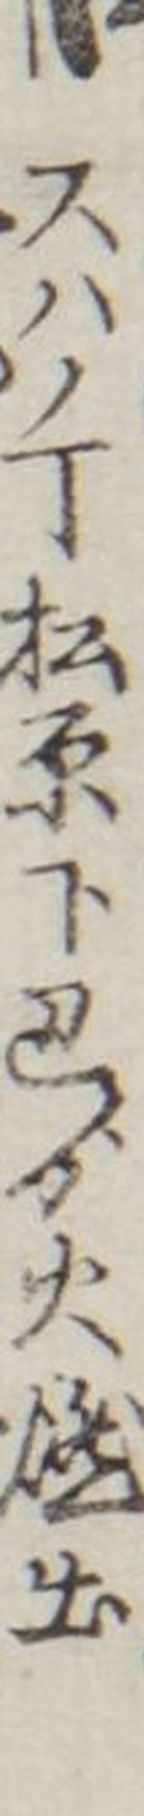スハノ丁松原下辺ゟ火燃出
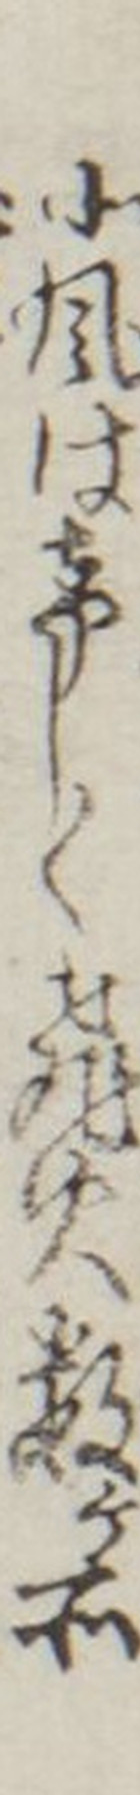北風はけしく飛火数ヶ所
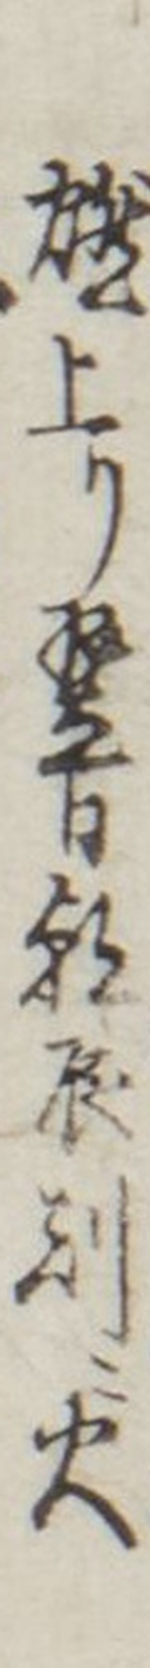燃上り翌日朝辰刻に火
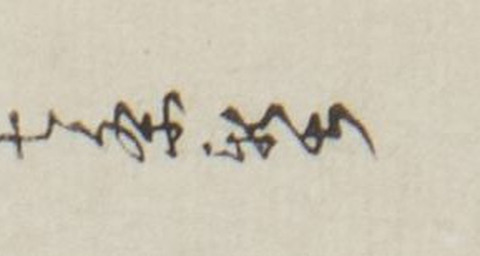七条新ち
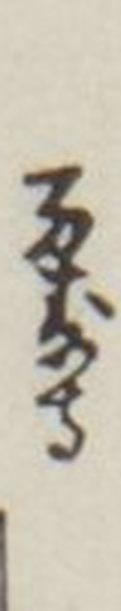万寿寺
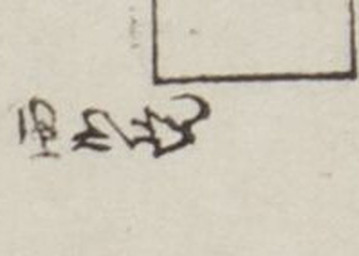西洞院
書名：京都出火略図
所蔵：あいおいニッセイ同和損保株式会社
